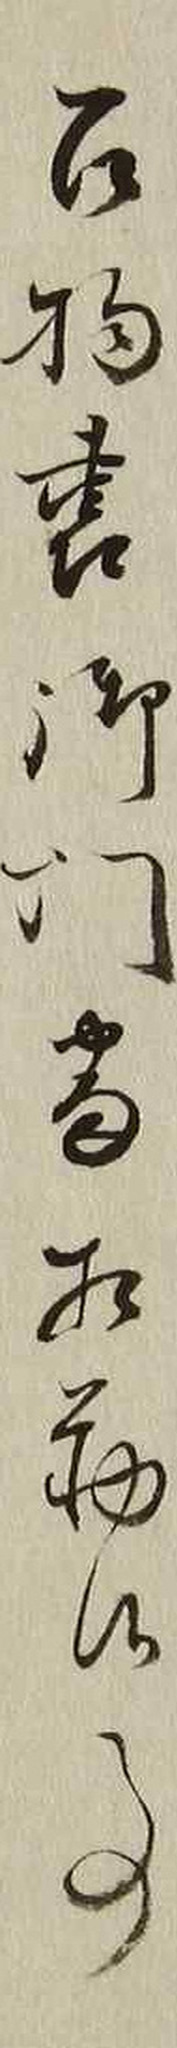召拘裏御門番相勤候事
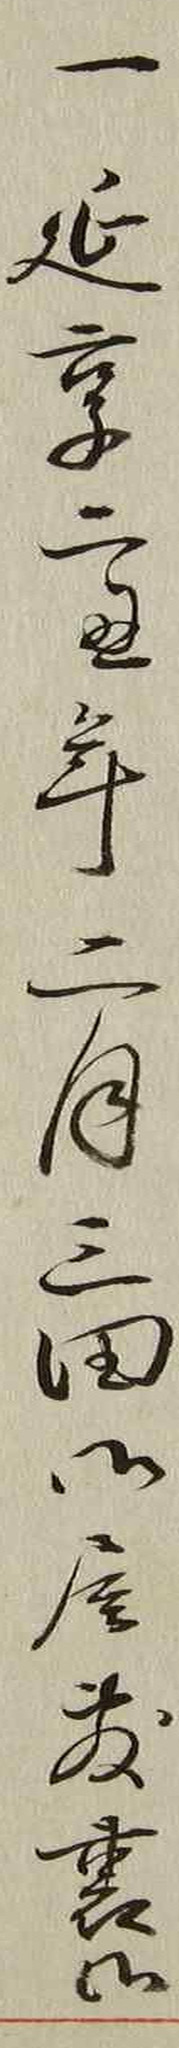一延享二丑年二月三田御屋敷裏御
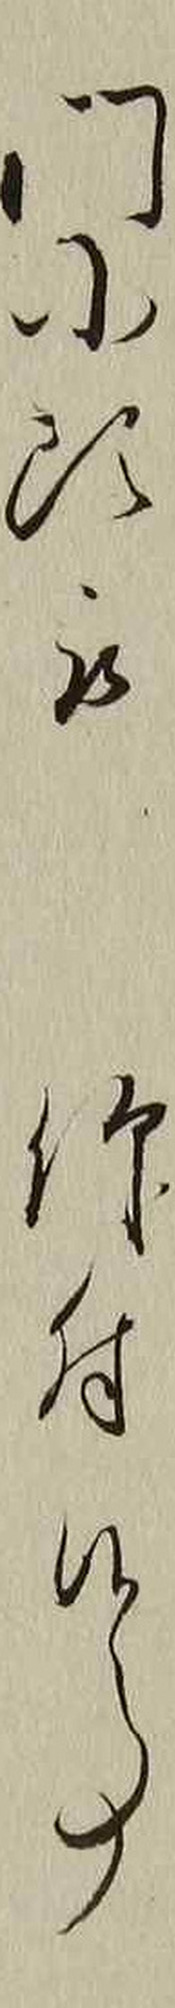門小頭被仰付候事
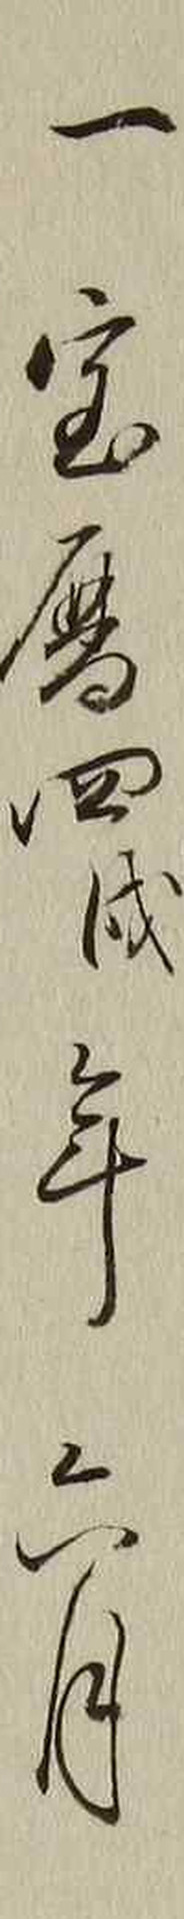一宝暦四戌年六月
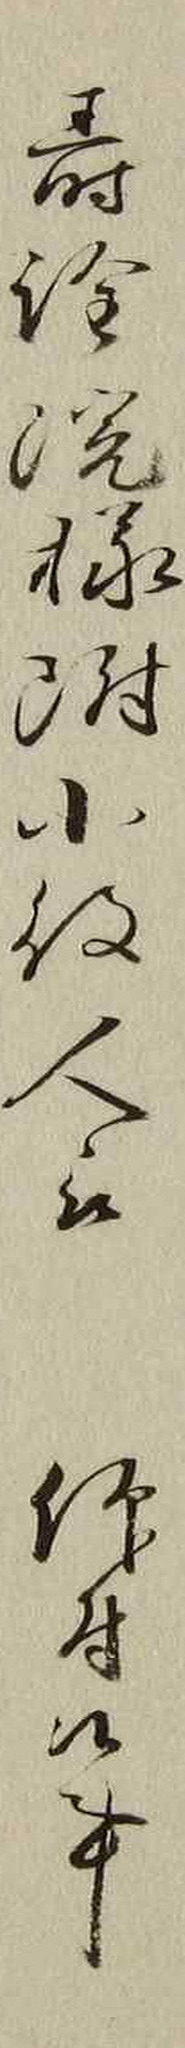寿詮院様附小役人被仰付候事
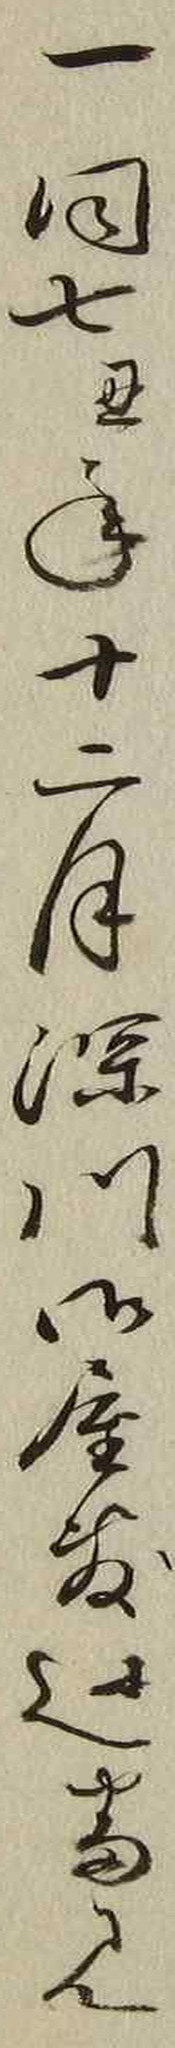一同七丑年十二月深川御屋敷辻番見
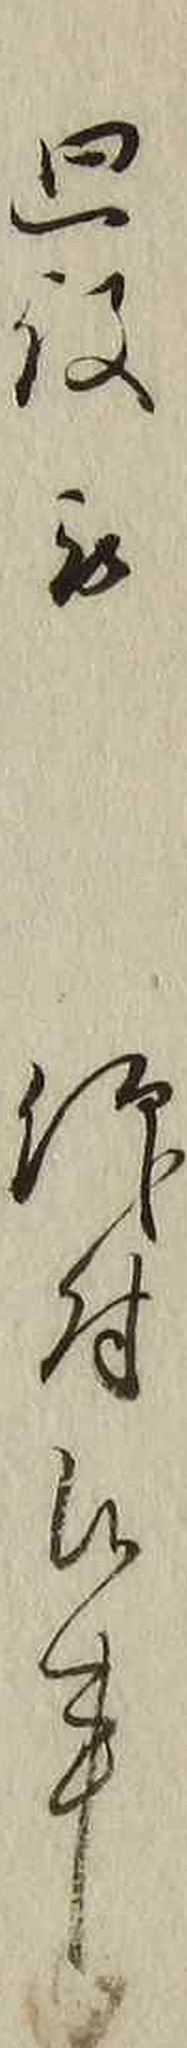廻役被仰付候事
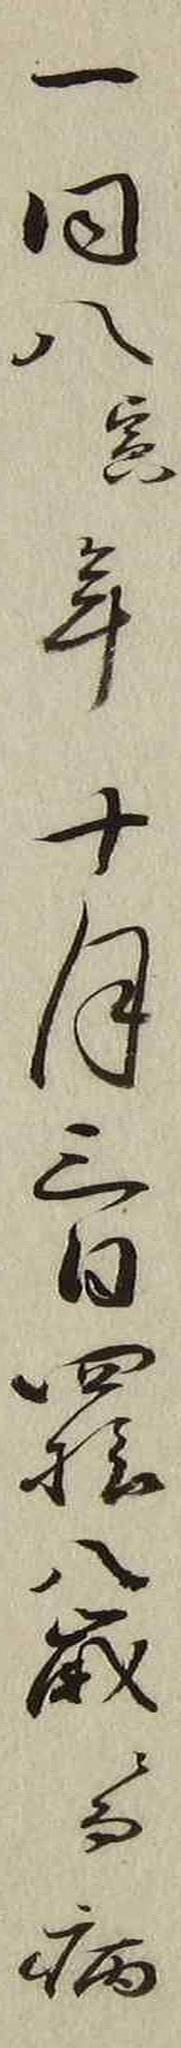一同八寅年十月三日四拾八歳ニ而病
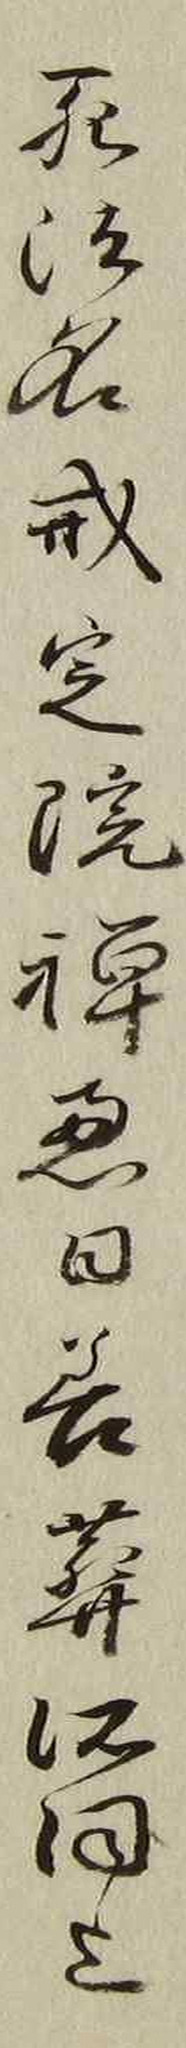死法名戒定院禅恵日善葬所同上
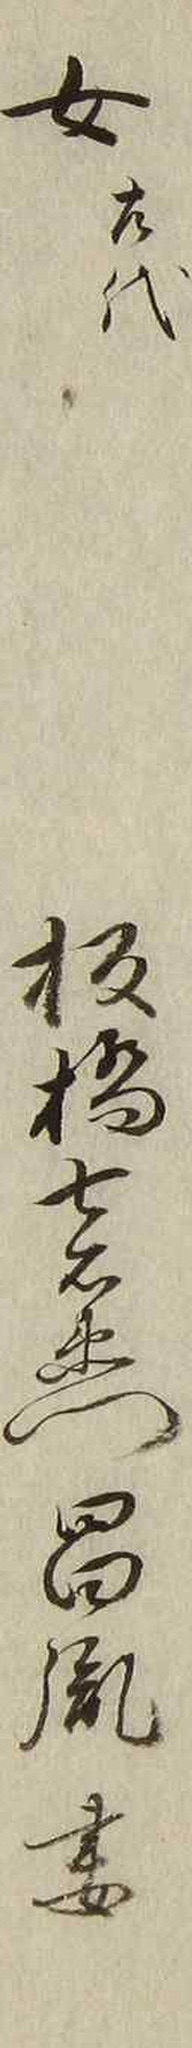板橋七右衛門昌胤妻
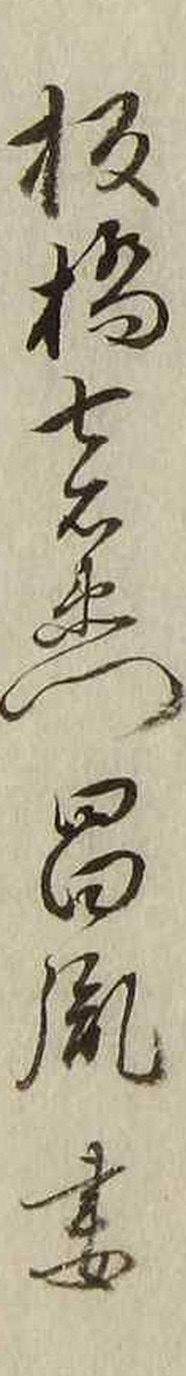板橋七右衛門昌胤妻

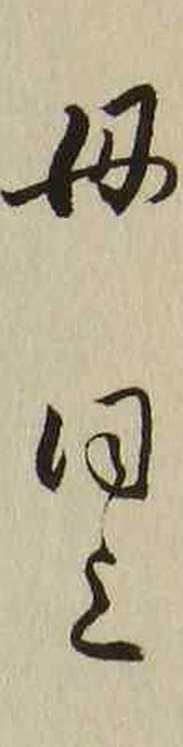母同上
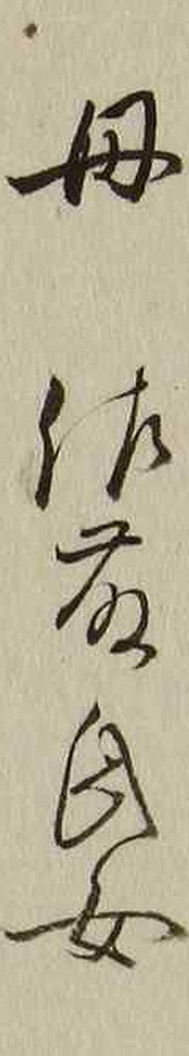母佐藤氏女
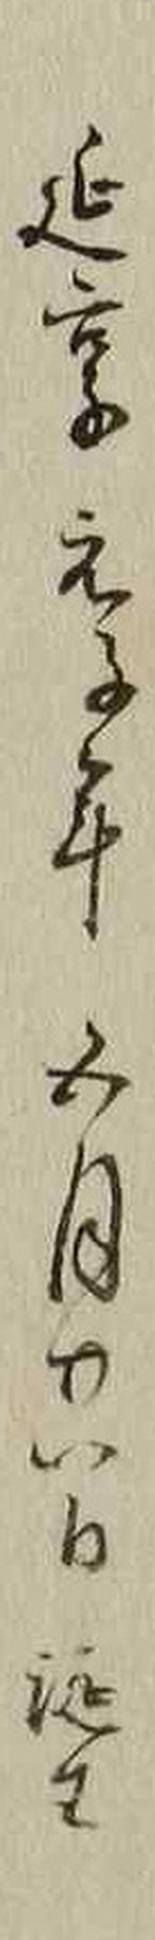延享元子年五月廿八日誕生
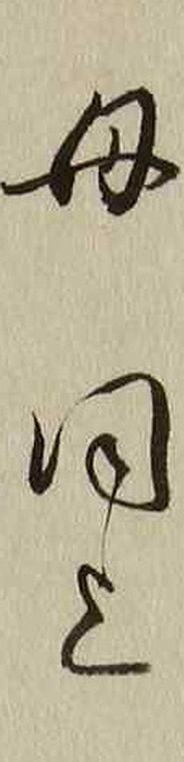母同上
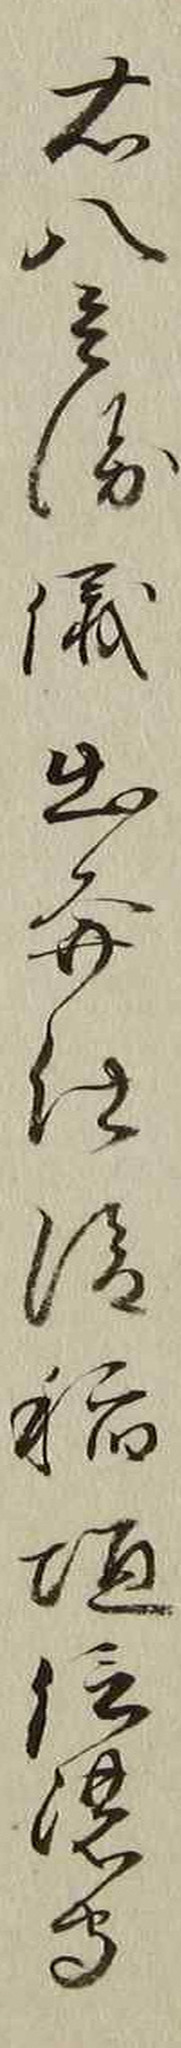右八兵衛儀出奔仕後稲垣信濃守
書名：諸士系譜　巻之4　い之部4
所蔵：会津若松市立会津図書館
